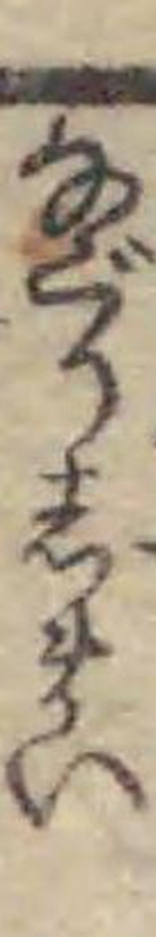なぐりしまい
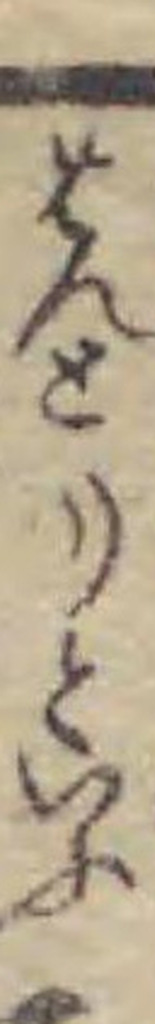はんとりといふ
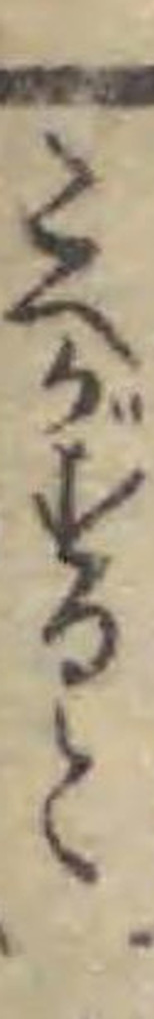こへがすると
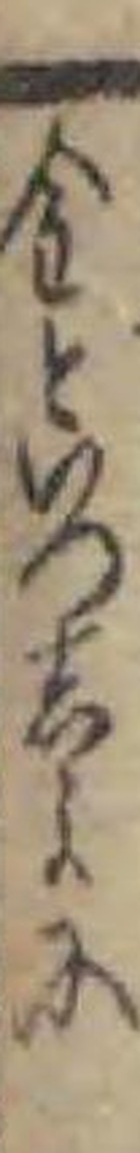金といつしよに
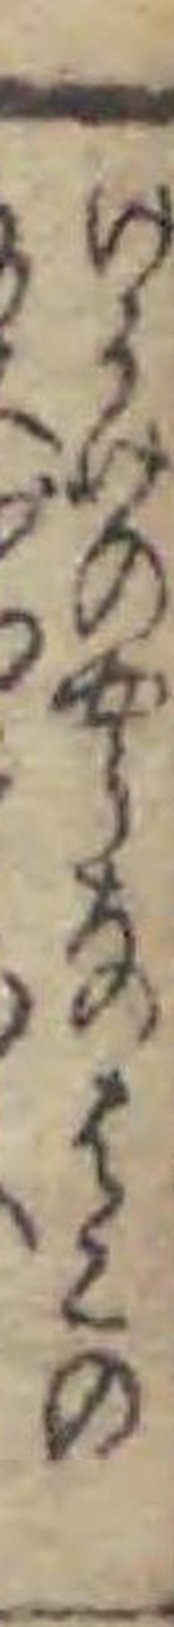けうけのやうなはこの
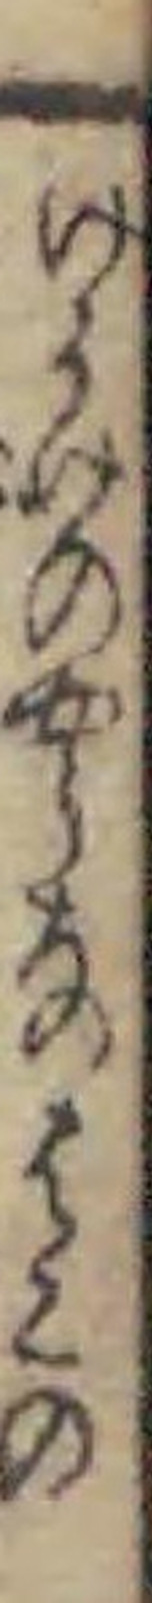けうけのやうなはこの
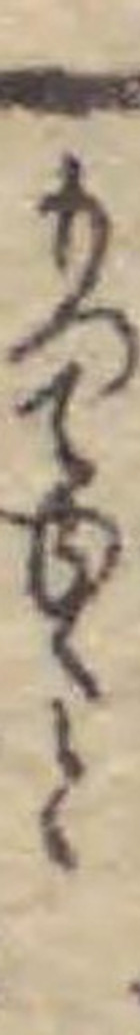もつてゆくと
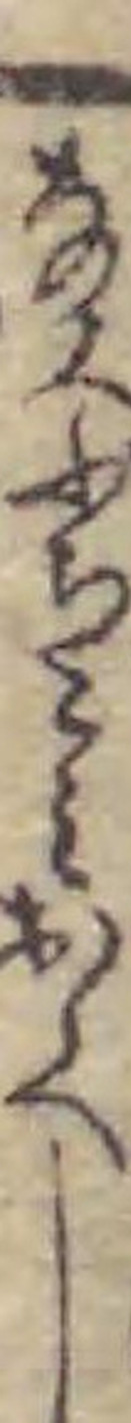なかへぶちこみおくへ
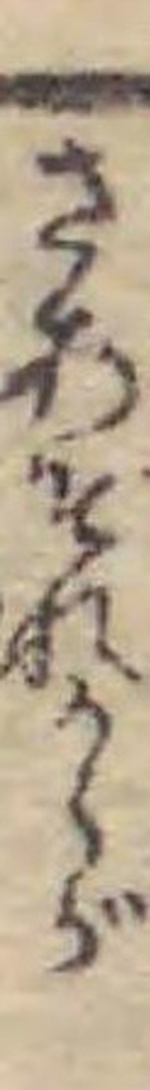さあそれからが
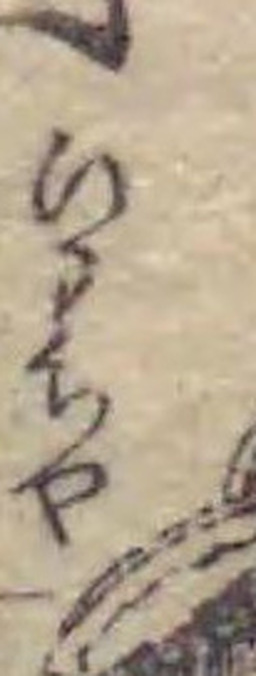ひわちや
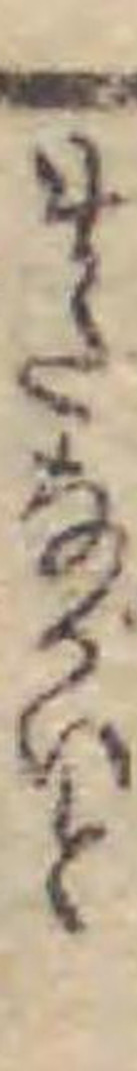またながいと
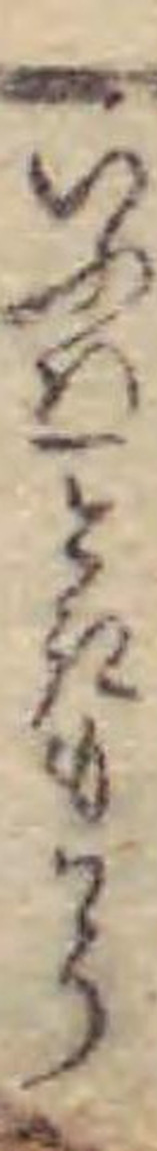いふは一ときもかゝり
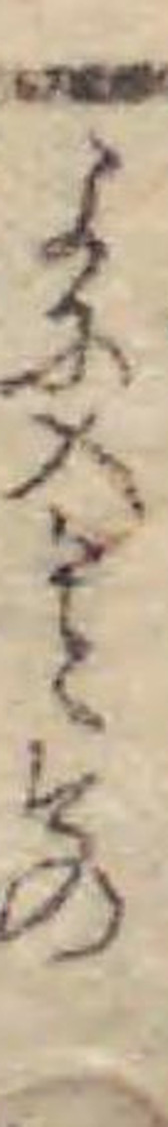よふ入かとその
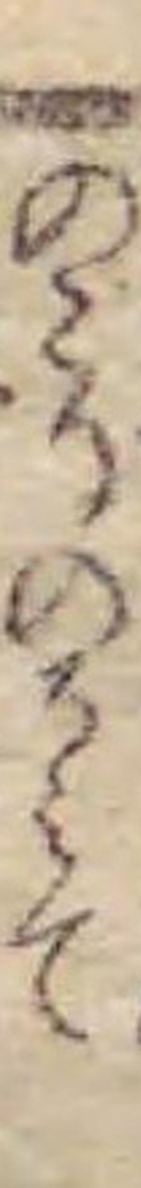のこりのかみて
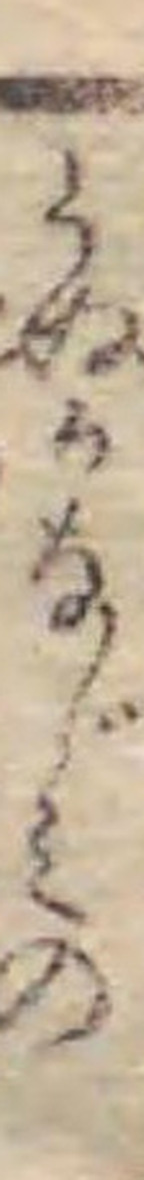うぬかなじみの
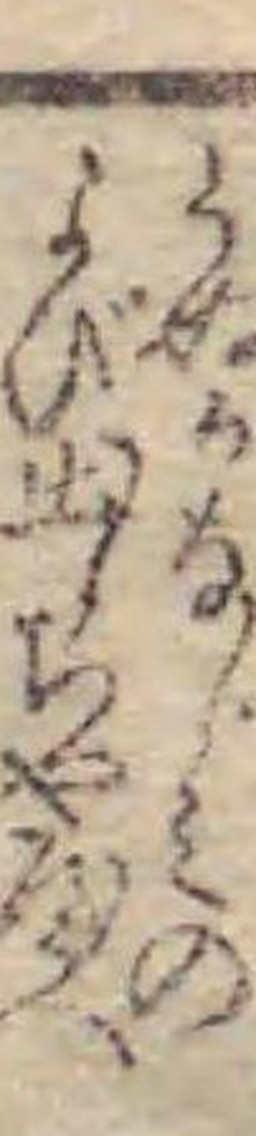よび出しちや屋へ
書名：紙屑身上噺 : 3巻
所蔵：国立国会図書館 National Diet Library, JAPAN
